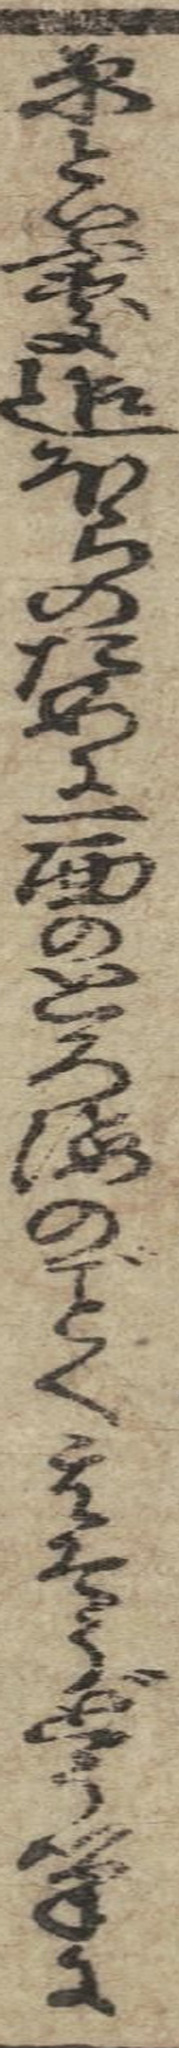原といふ処迄ほらのに一面のとろ海のごとく其そうどう筆に
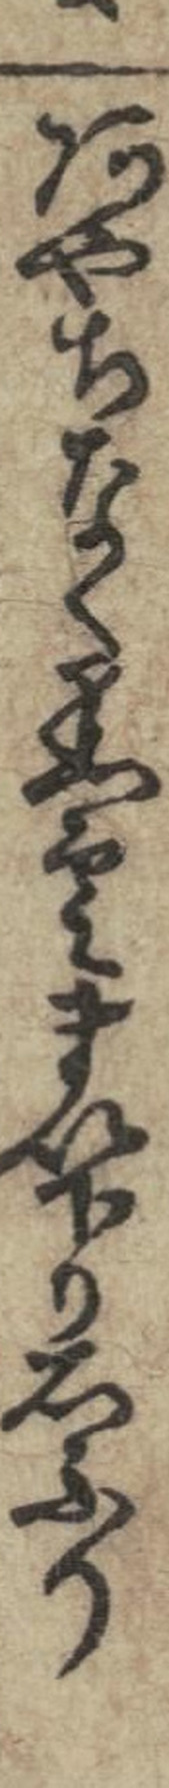あやちなく黒雲まい下り石ふり
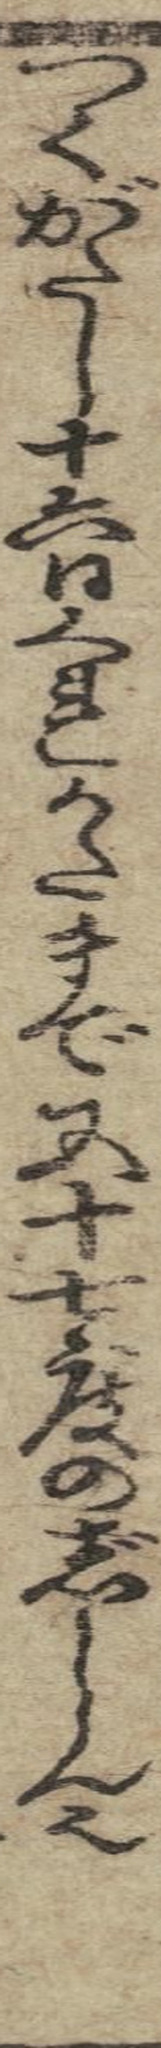つくがたし十六日くれかたまで五十七度のじしん也
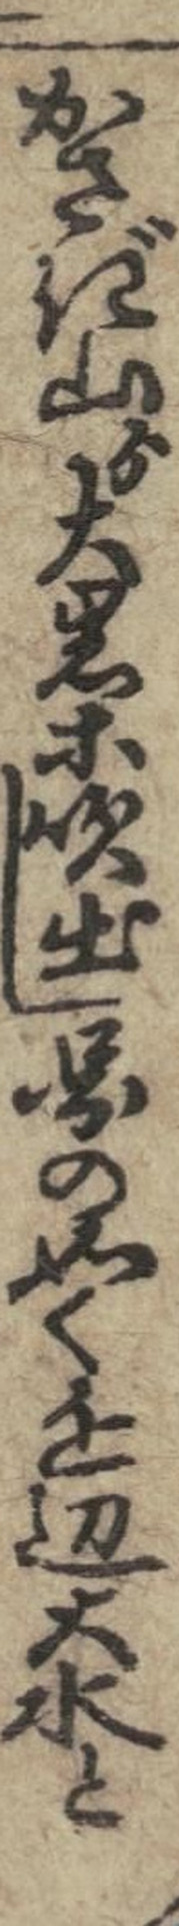かさぎ山ゟ大岩等吹出し図の如く近辺大水と
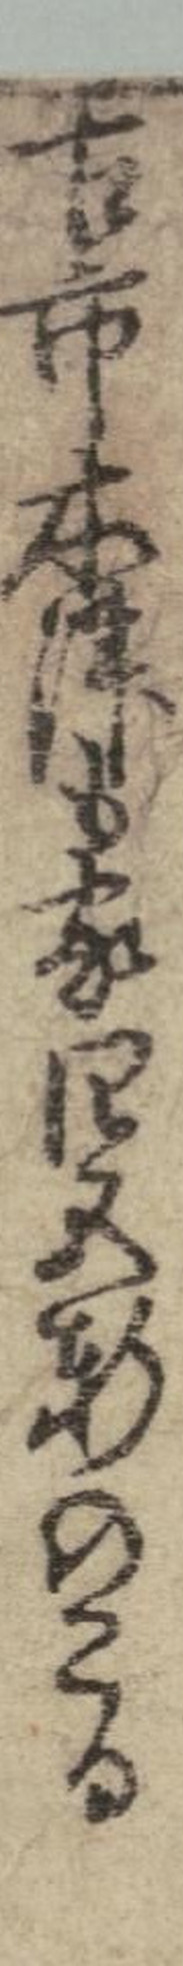古市木津も家四五軒のこる
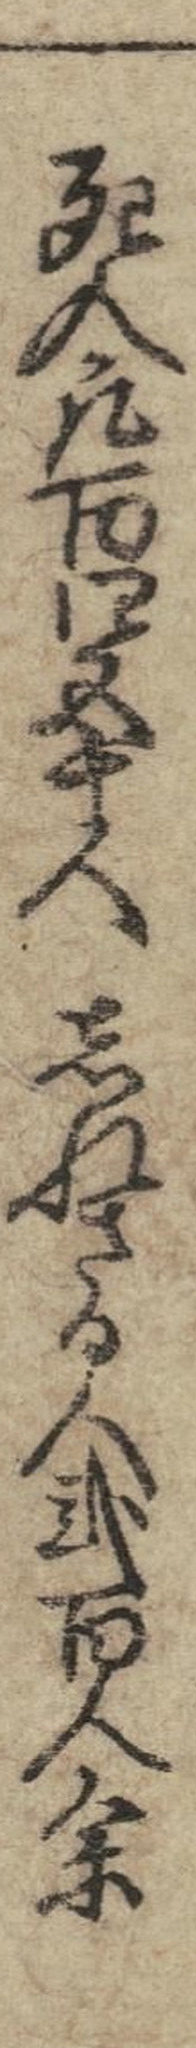死人凡百四五十人しれざる人弐百人余
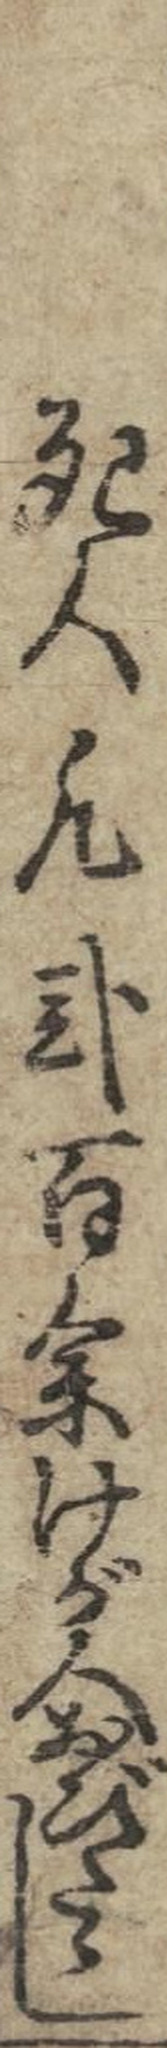死人凡弐百余けが人おびたゝし
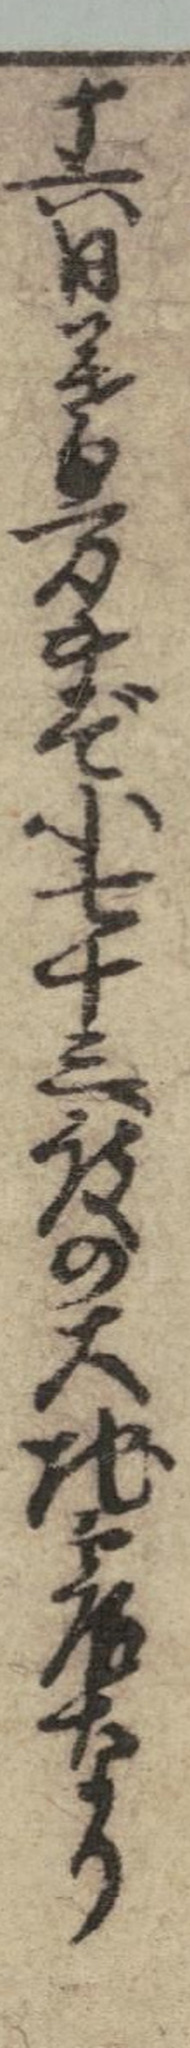十六日暮方までに七十三度の大地震なり
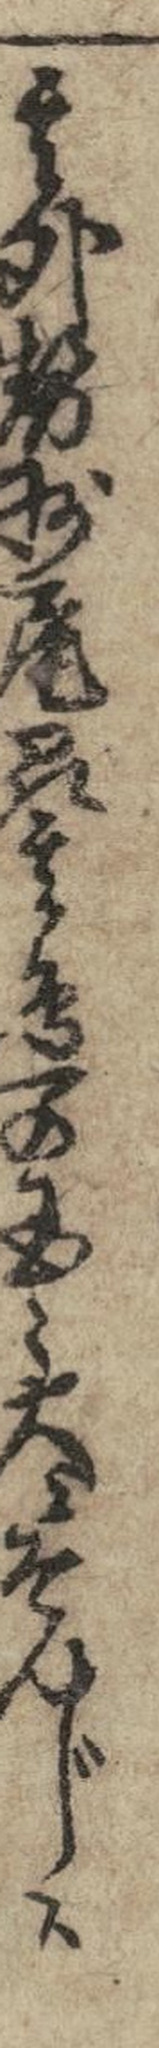其外勢州尾州其辺の国々大にそんじ候
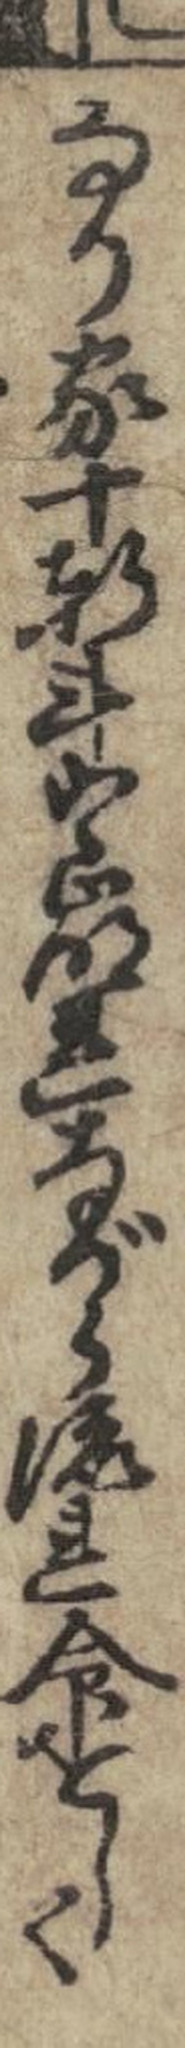なり家十軒計山崩れながら潰れ命をしく
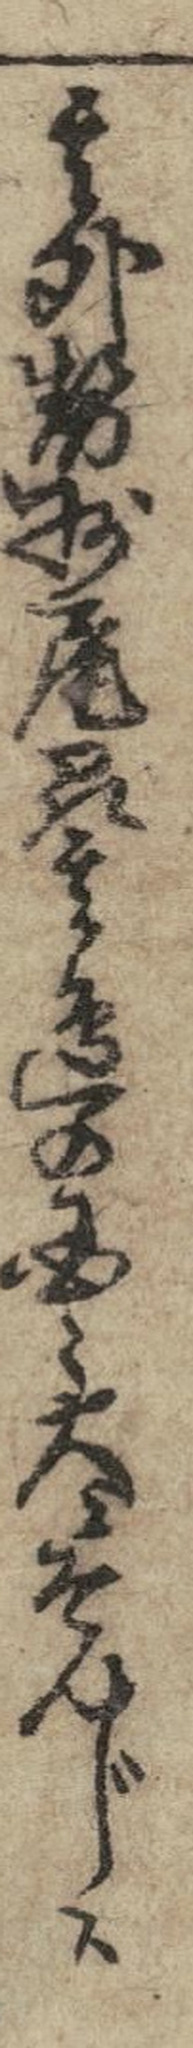其外勢州尾州其辺の国々大にそんじ候
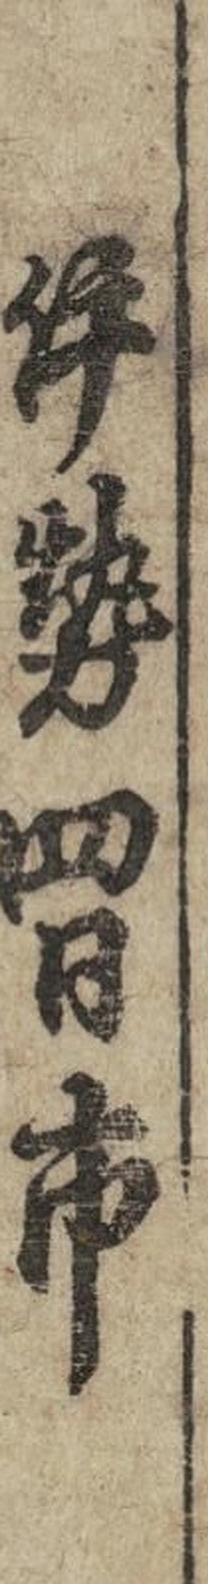伊勢四日市
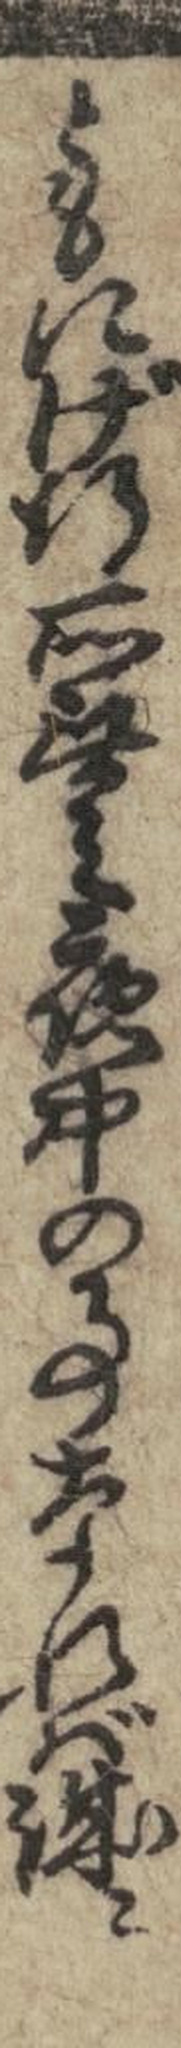ともにげ行所無く夜中の事なれば誠に
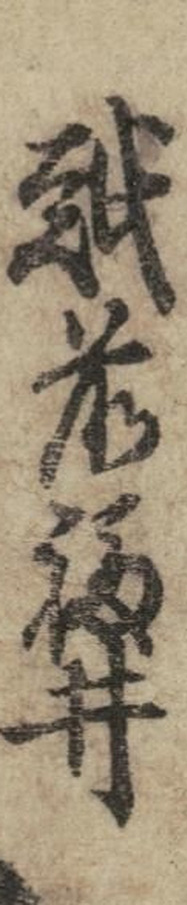越前福井
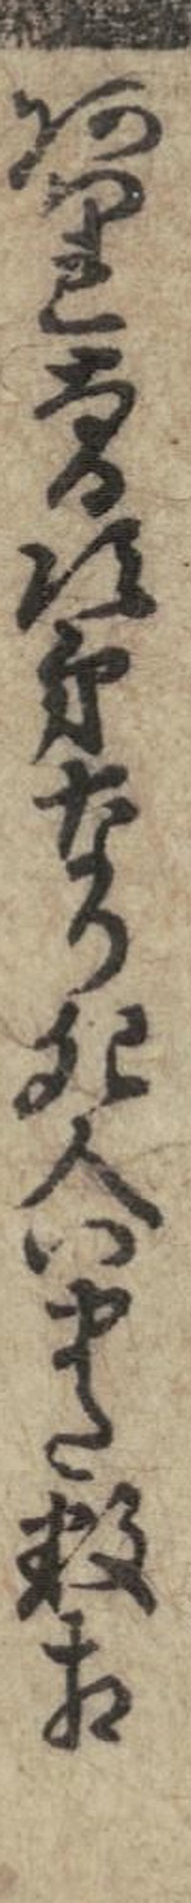あはれなる次第なり死人いまた数相
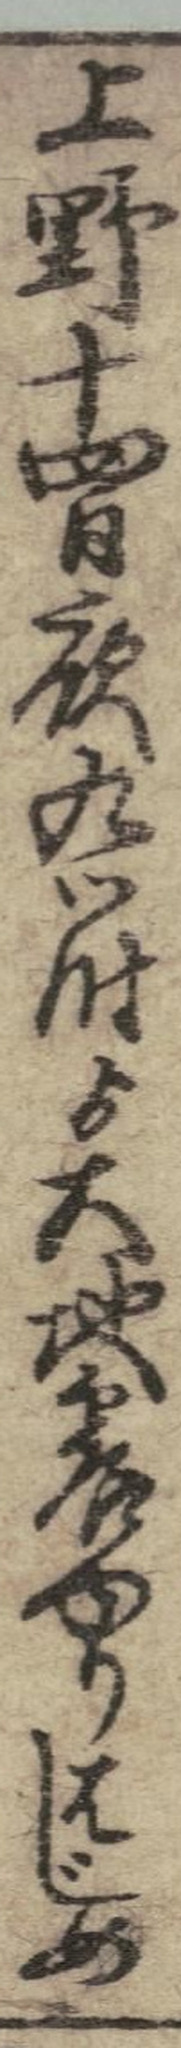上野十四日夜九ツ時ゟ大地震ゆりはじめ
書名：聞書　諸國大地震并ニ出火・早飛脚廻りにてくわしき所本しらべ　大地震・山城勢州大和三河江州越前　聞書　大地震並ニ出火の次第
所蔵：東京大学地震研究所図書室 Earthquake Research Institute Library, The University of Tokyo, JAPAN
